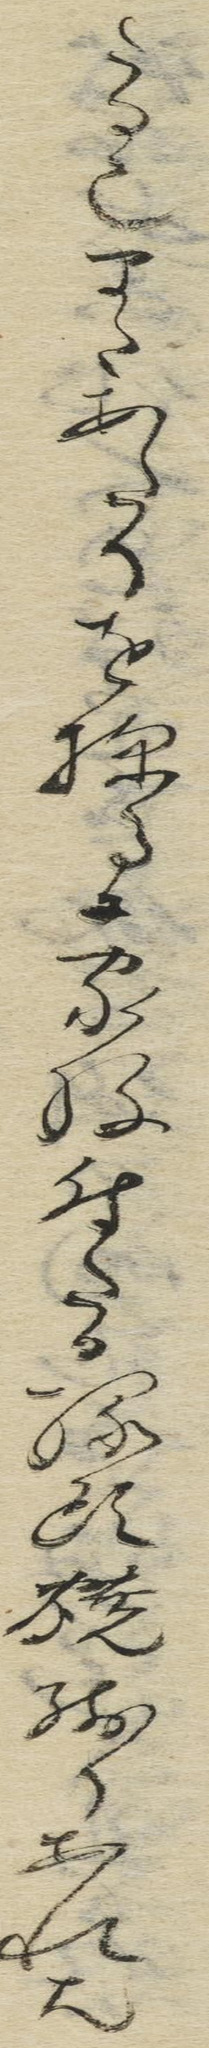たる也またあたりを探るに家紋付たる縁頭焼残りあれは
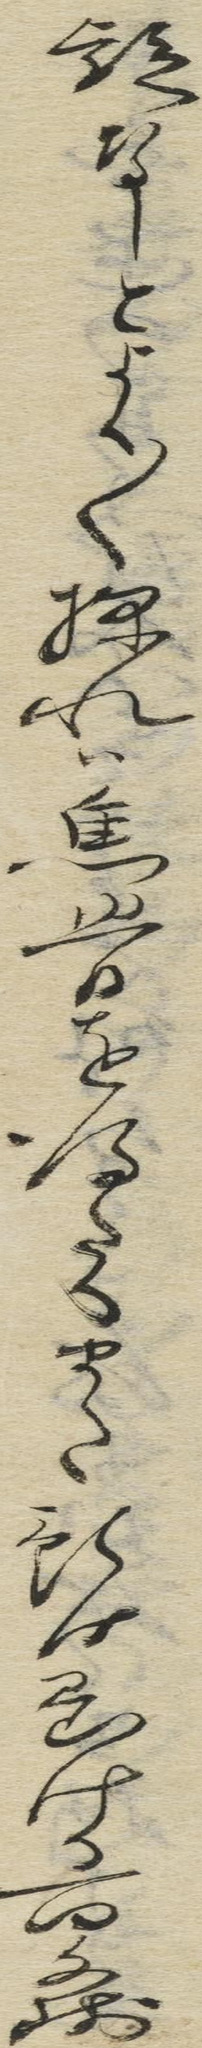疑なしとよく〳〵探れハ焦骨を得たりまた預け置ける百文銭
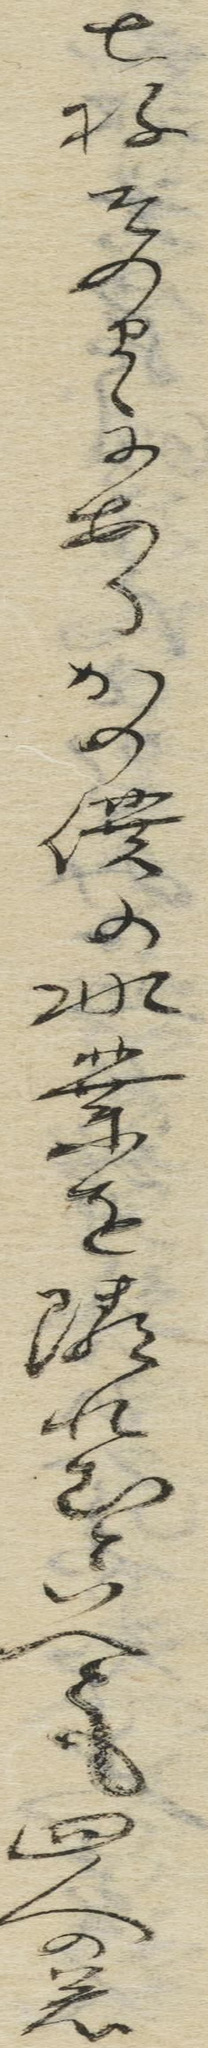七枚そのまゝにありかの僕の非業を憐れむといへとも四人の若
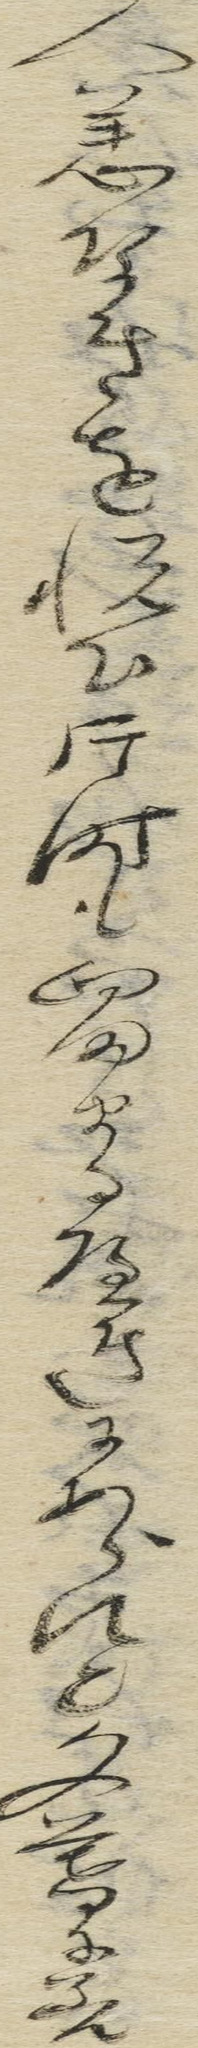人恙なきを悦ひ片時も面白なるへきにあらすと夕暮に善
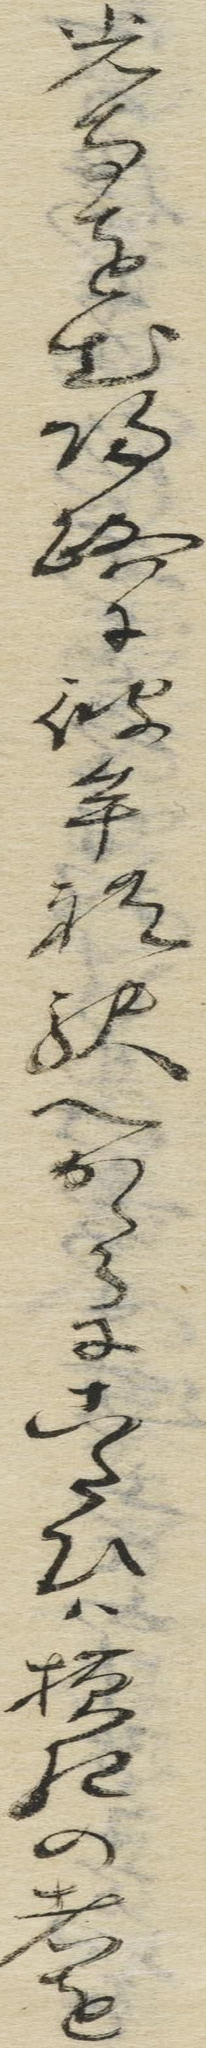光寺を出帰路に彼牟礼駅へかゝるにこたひハ横死の者を
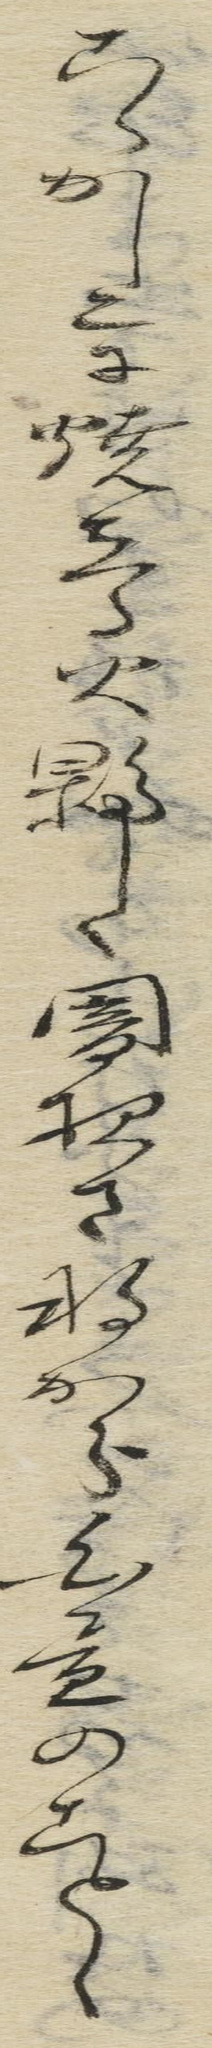こゝかしこに焼立る火夥しく闇夜さなからま昼のことし
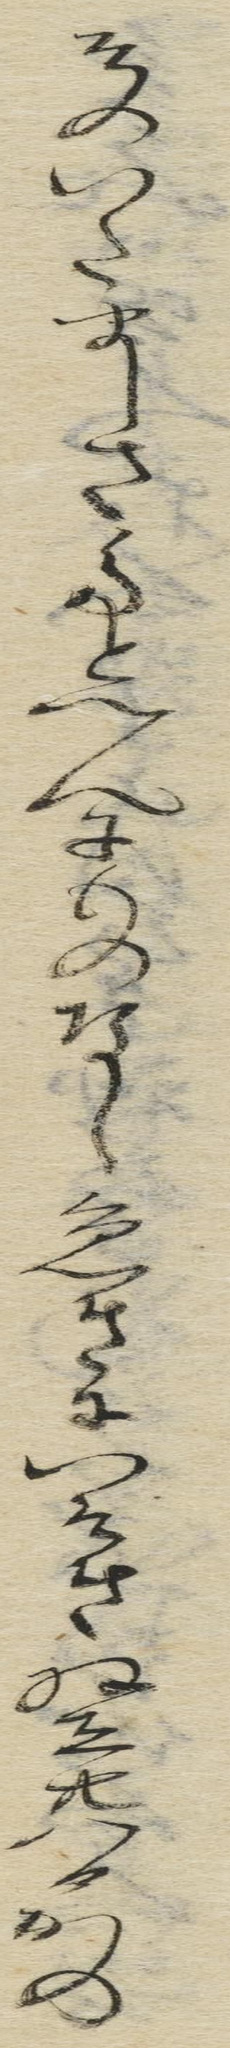そのいたましさたとへんにものなし急きにいそき翌廿八日かの
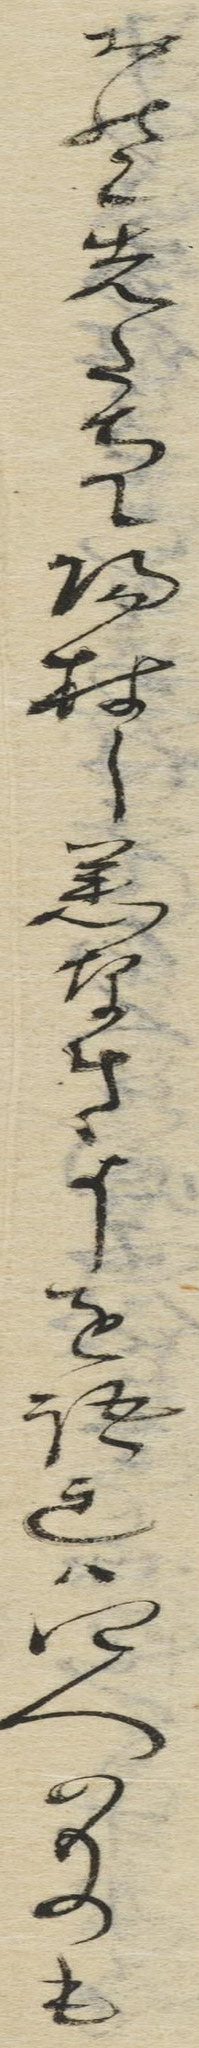おのこ先たちて帰村し恙なきよしを語れハ四人のものも
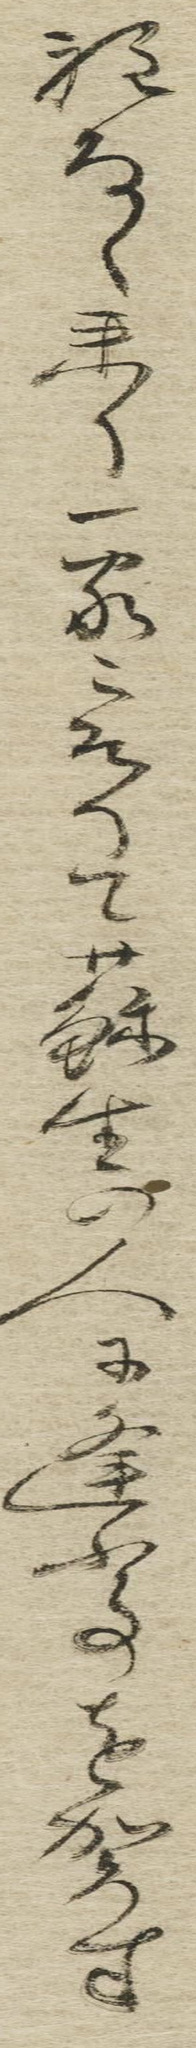程なく参り一家こそつて蘇生の人に逢うふる事を賀す
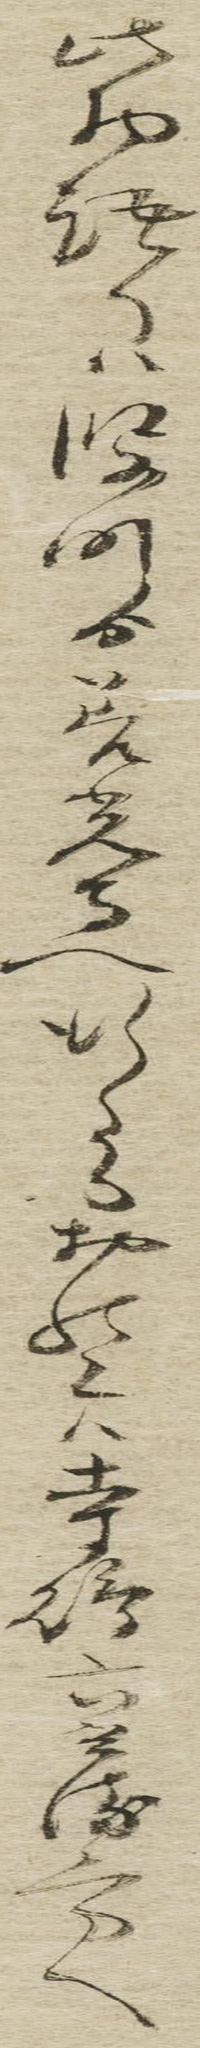此物語りハ潟町ゟ善光寺へ行たるおのこハ寺嶋六兵衛方へ
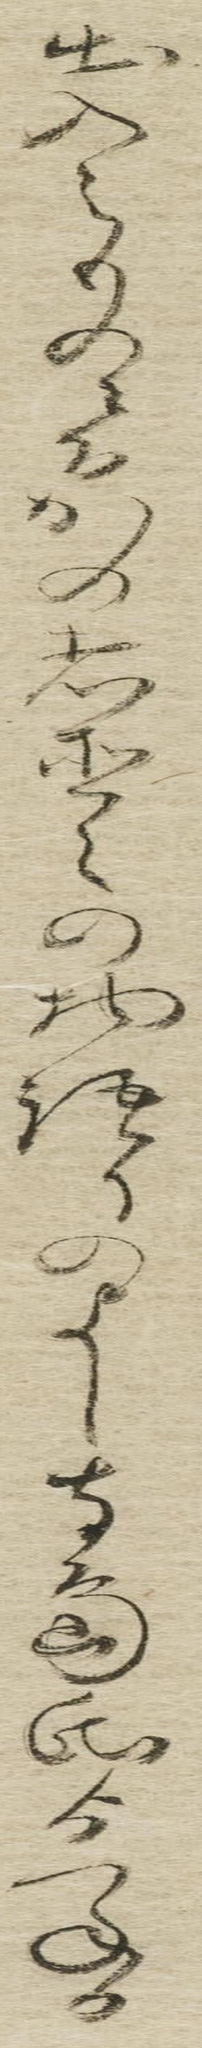出入しものにてかの者登ての物語りのよし寺嶋氏ゟ事の
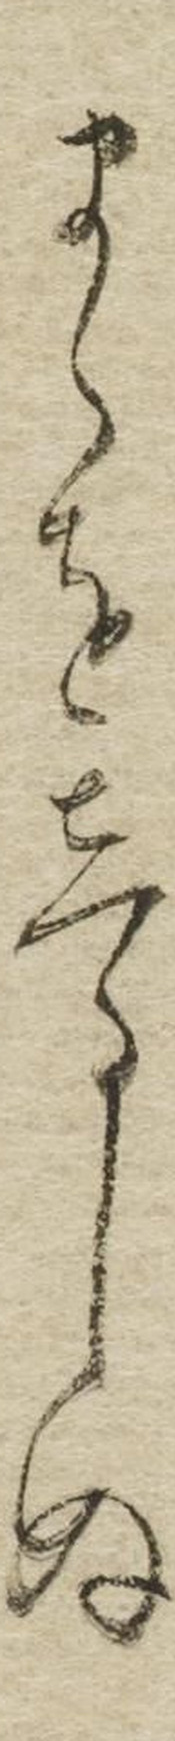まゝをしるしぬ
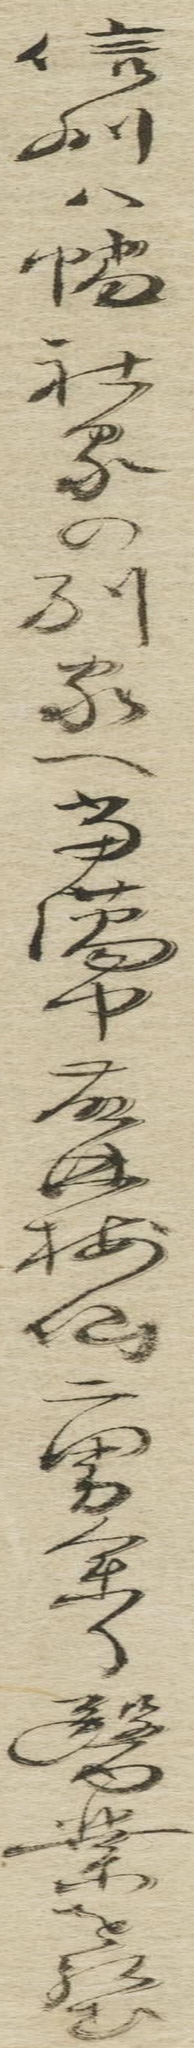信州八幡社家の列家へ当藩中藤林梅仙二男参り医業を始む
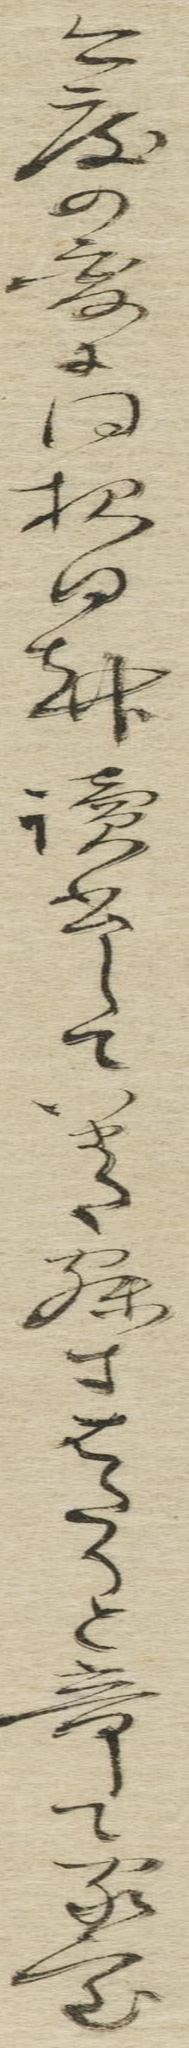今度の変に同夜同刻読書していまた寝すはかりと音して家宅
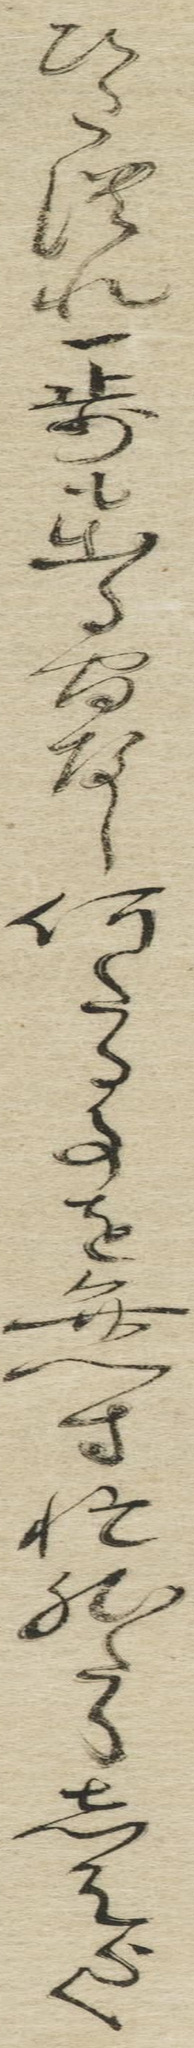ひた潰れ一歩も出る間なし何たる事を弁へす茫然たりしはらく
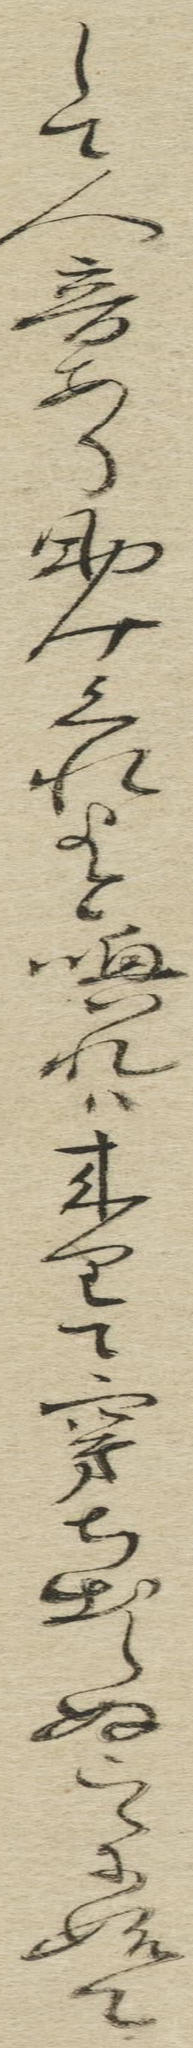して人音あり助けくれよと喚れハ来りて穿ち出しぬこゝに始て
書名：弘化丁未天變日記
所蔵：東京大学地震研究所図書室 Earthquake Research Institute Library, The University of Tokyo, JAPAN
